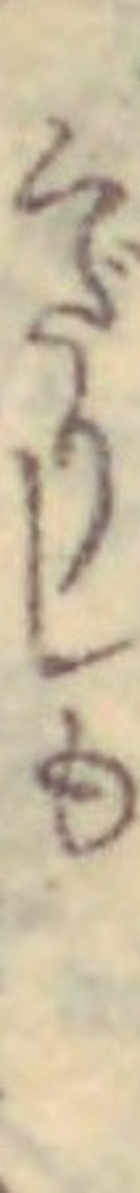くだりしも
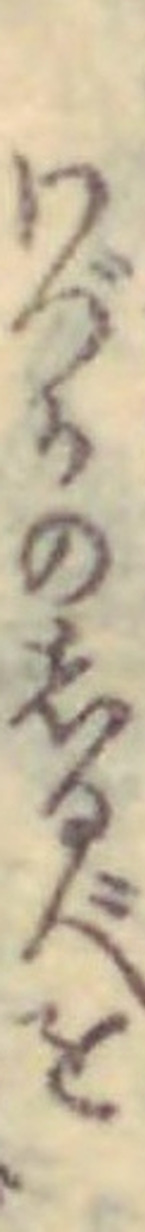わづかのしるべを
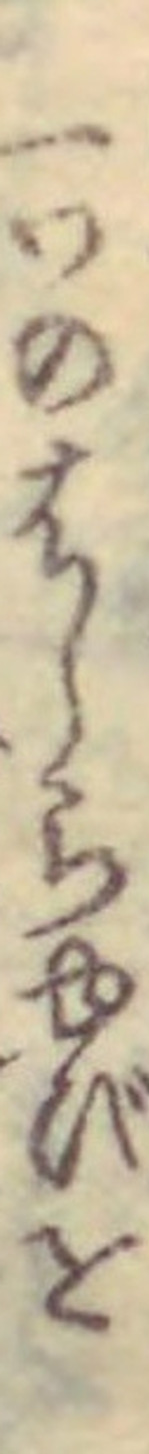一つのはしらゆびを
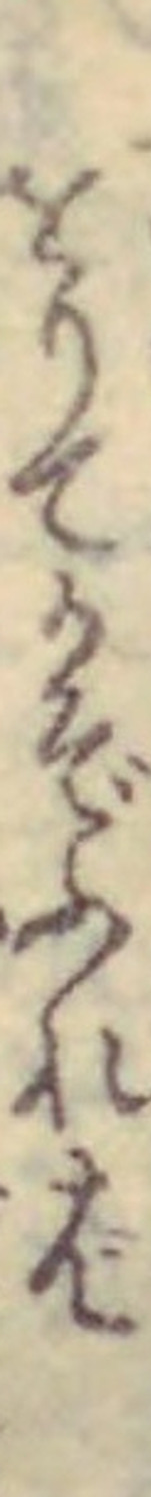をりてかぞふれば
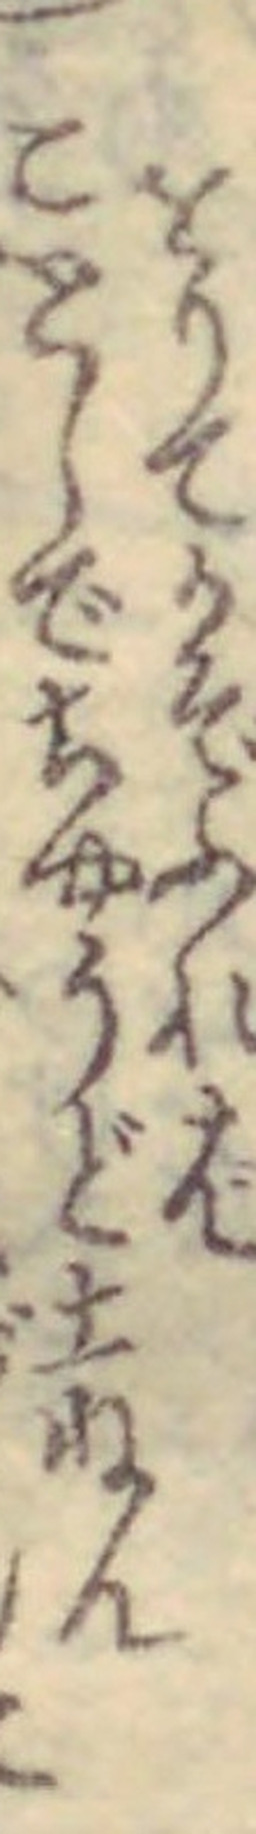ことしでちやうど十一ねん
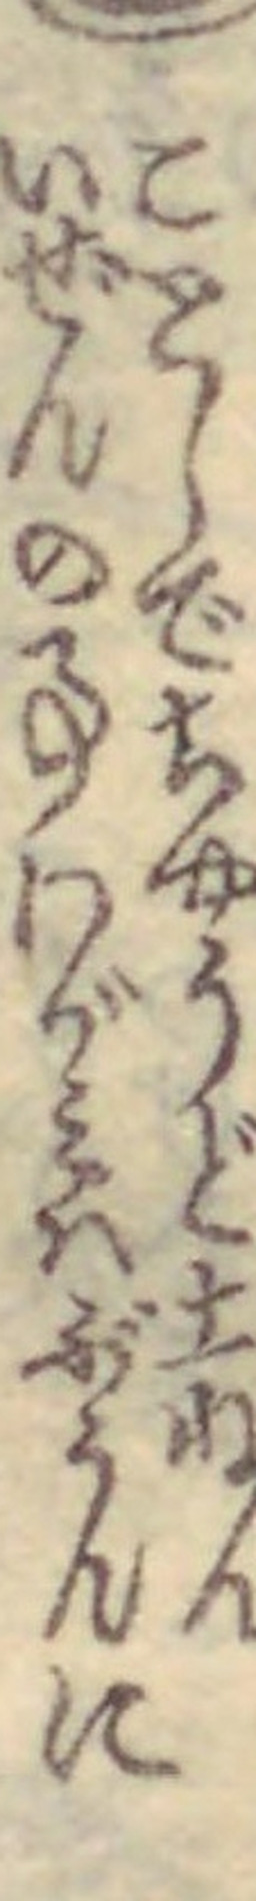いぜんの事わがみはぶうんに
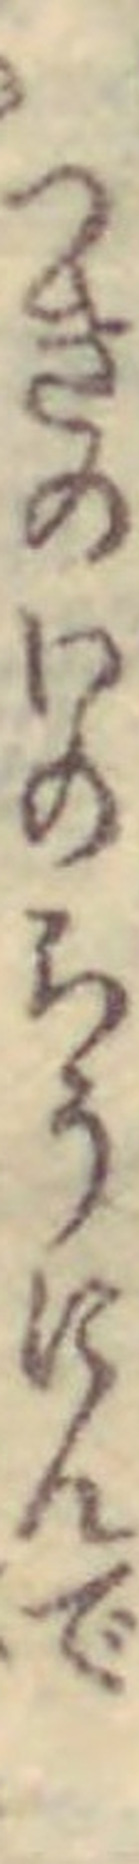つきのわのらうにんで
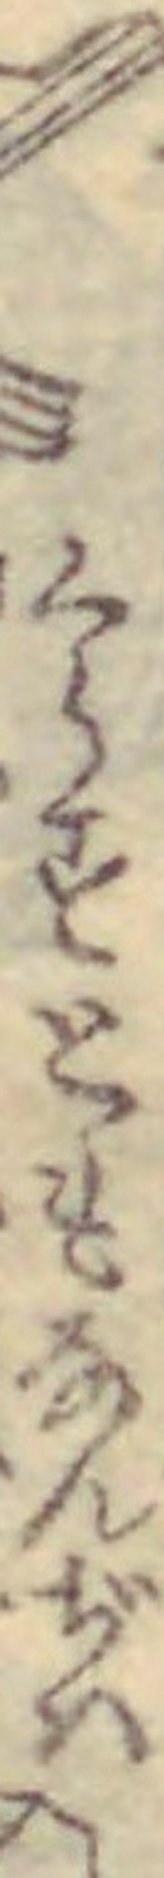くらすともなんぢは
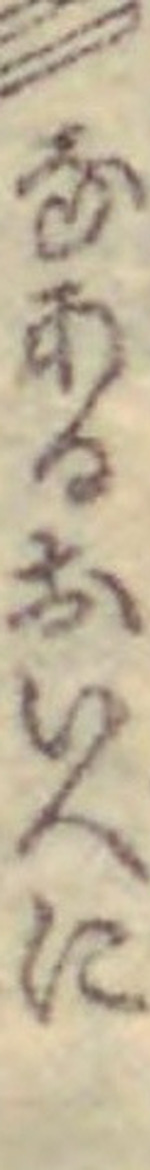なあるおいへに
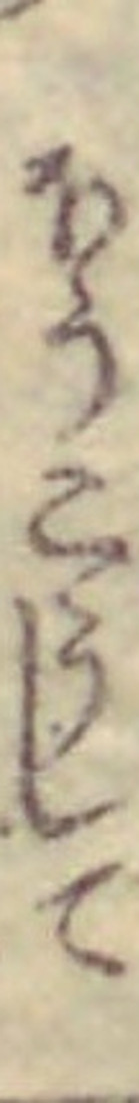ほうこうして
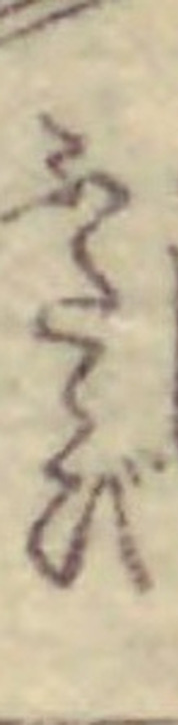ふたゝび
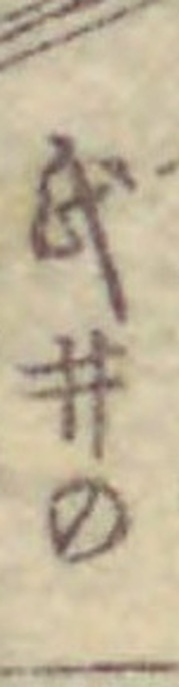氏井の
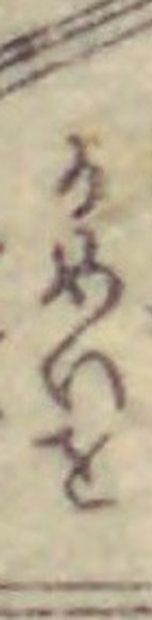かめいを
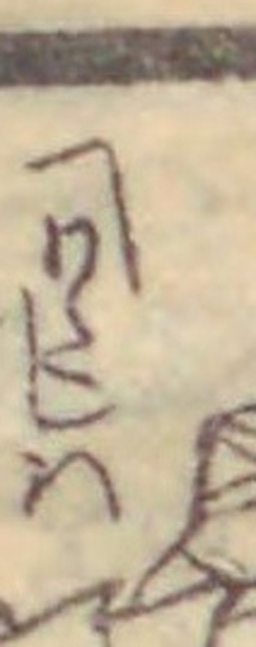〽わたしは
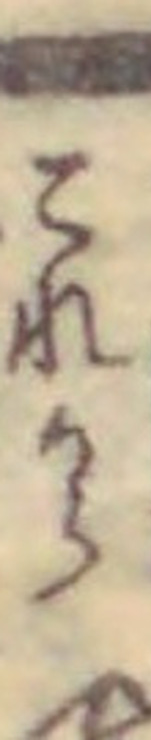これから
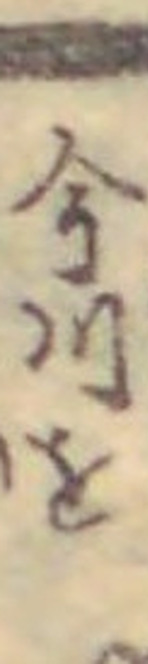今川を
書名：八ツ目鱣因縁物語 3巻
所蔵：国立国会図書館 National Diet Library, JAPAN
